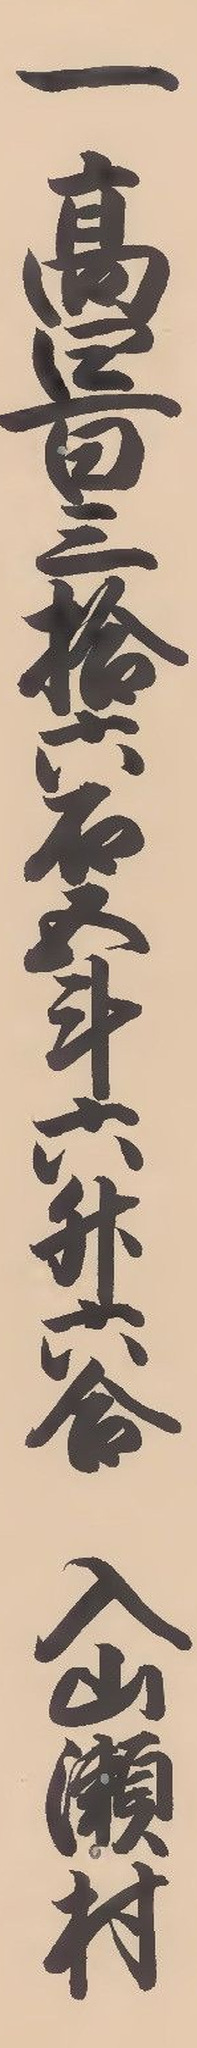一高四百三拾六石五斗六升六合入山瀬村
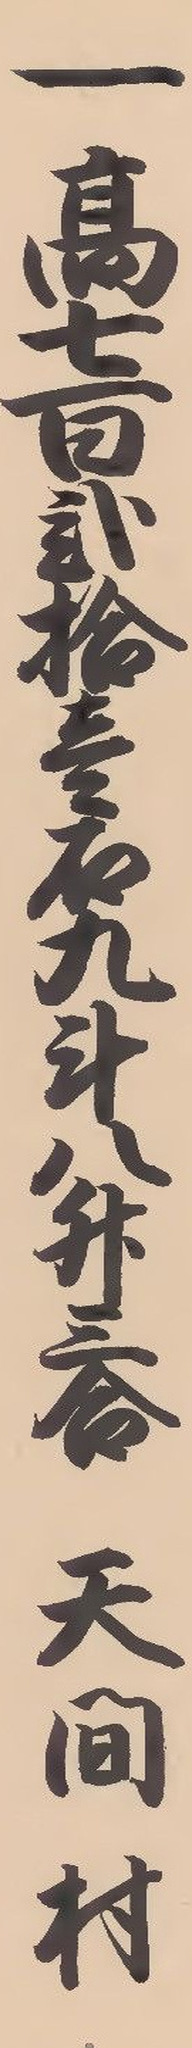一高七百弐拾壱石九斗八升三合天間村
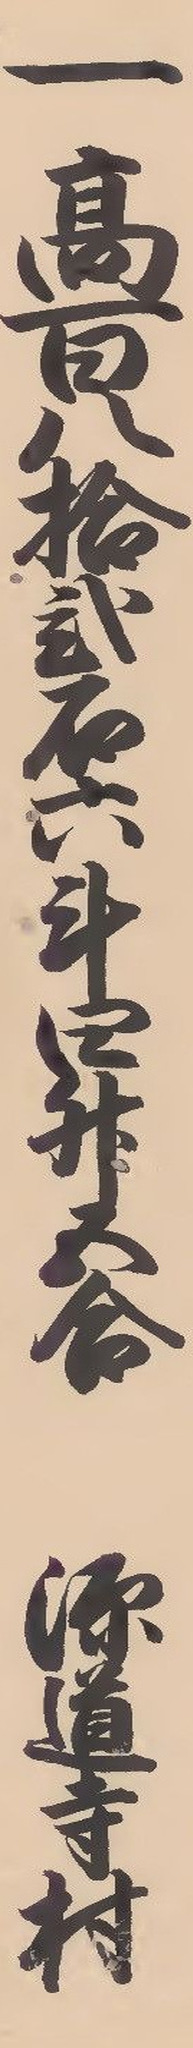一高百八拾弐石六斗四升五合源道寺村

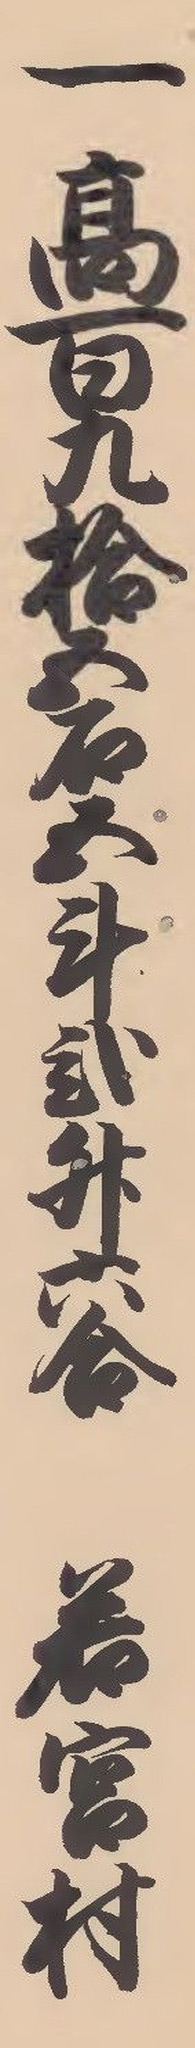一高百九拾五石五斗弐升六合若宮村
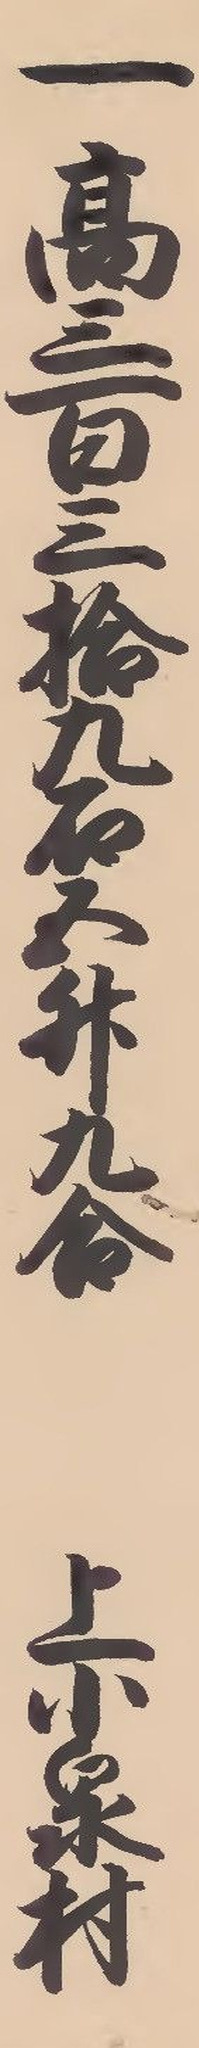一高三百三拾九石五升九合上小泉村
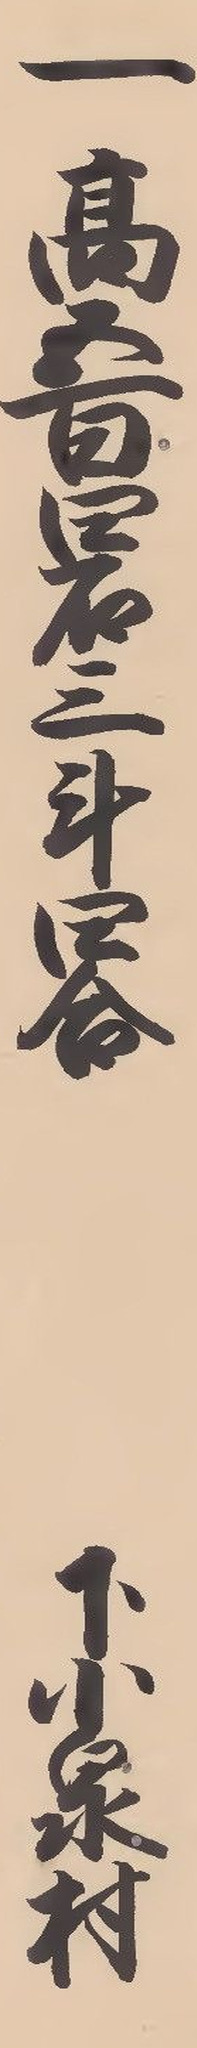一高五百四石三斗四合下小泉村
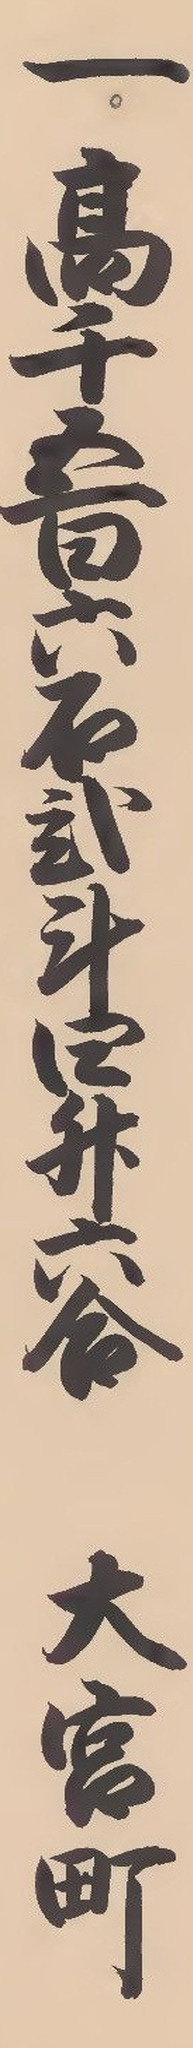一高千五百六石弐斗四升六合大宮町
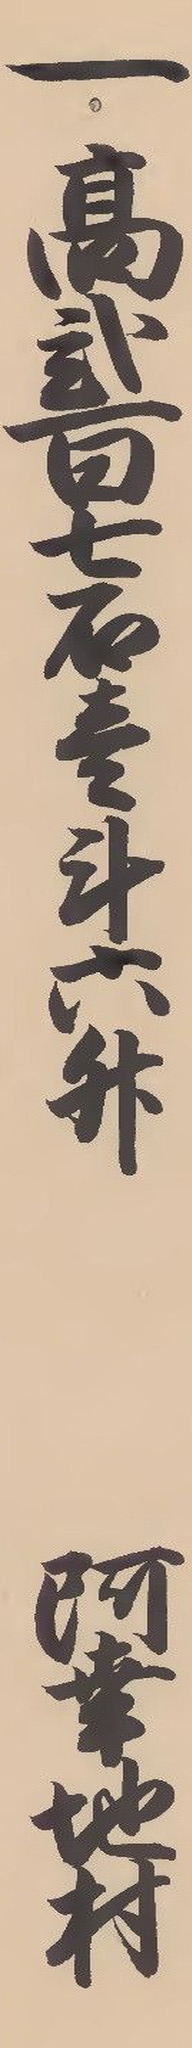一高弐百七石壱斗六升阿幸地村
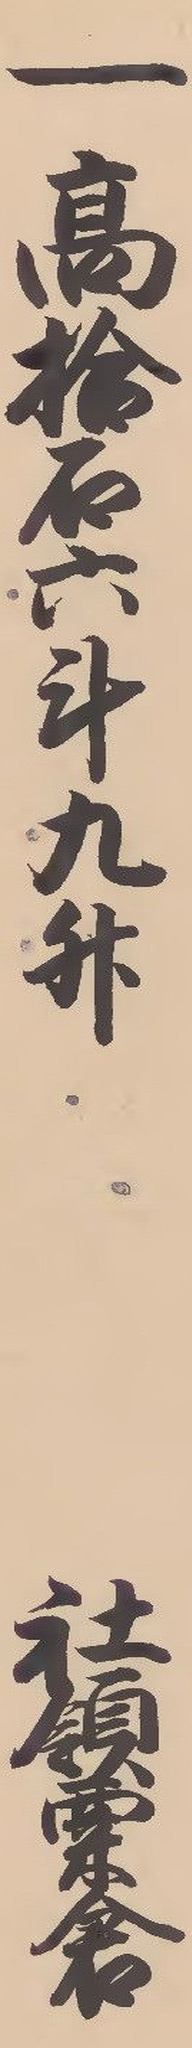一高拾石六斗九升社領粟倉

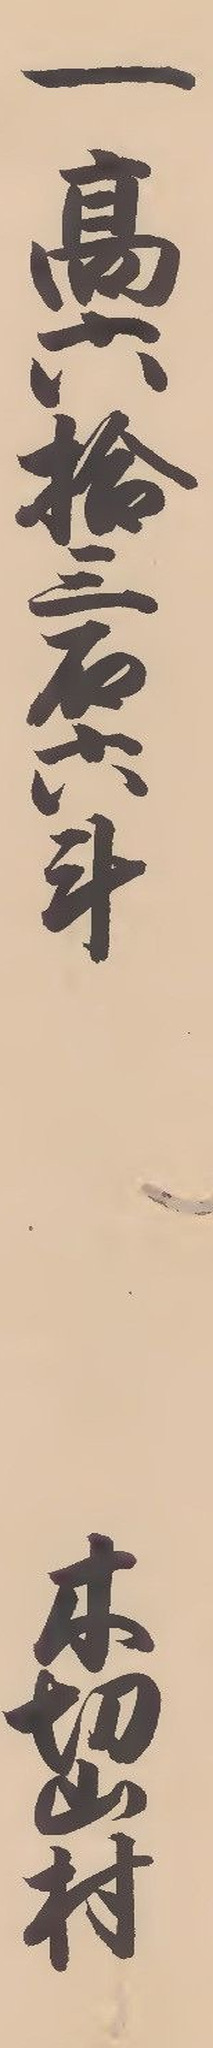一高六拾三石六斗木切山村
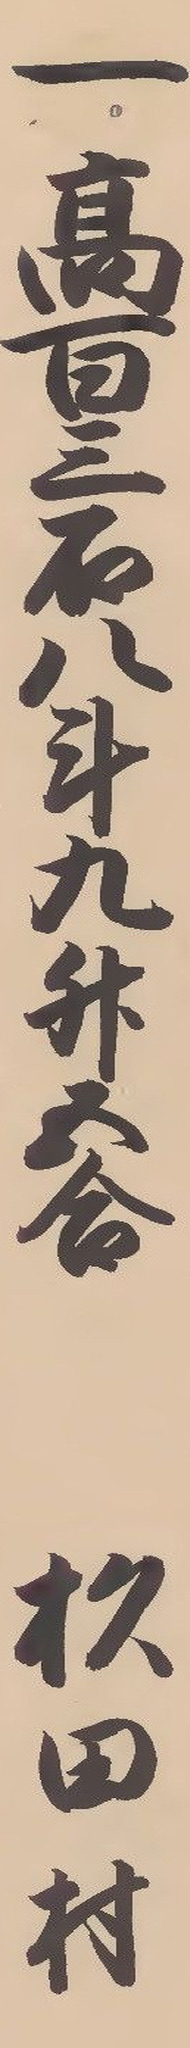一高百三石八斗九升五合杉田村
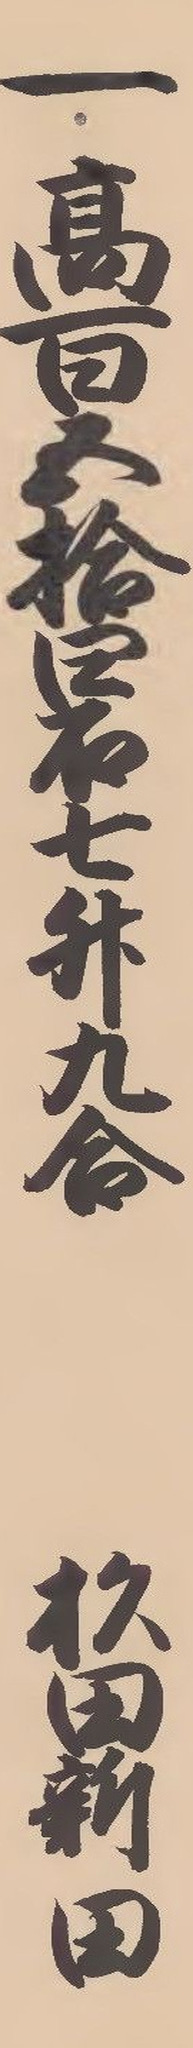一高百五拾四石七升九合杉田新田
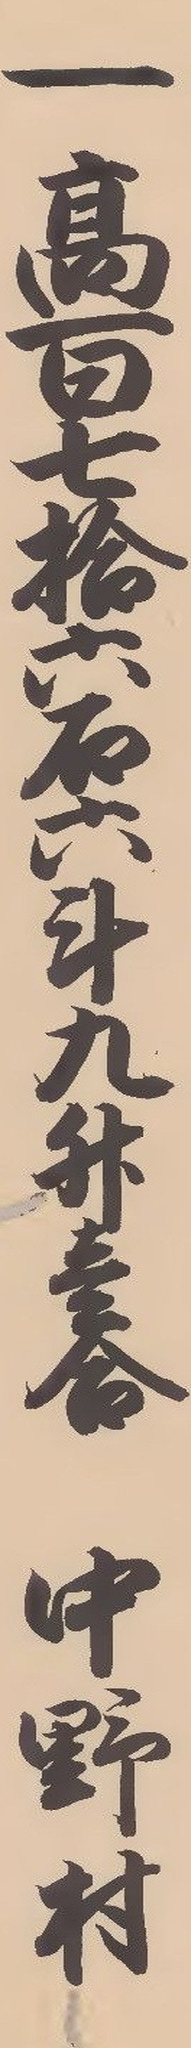一高百七拾六石六斗九升壱合中野村
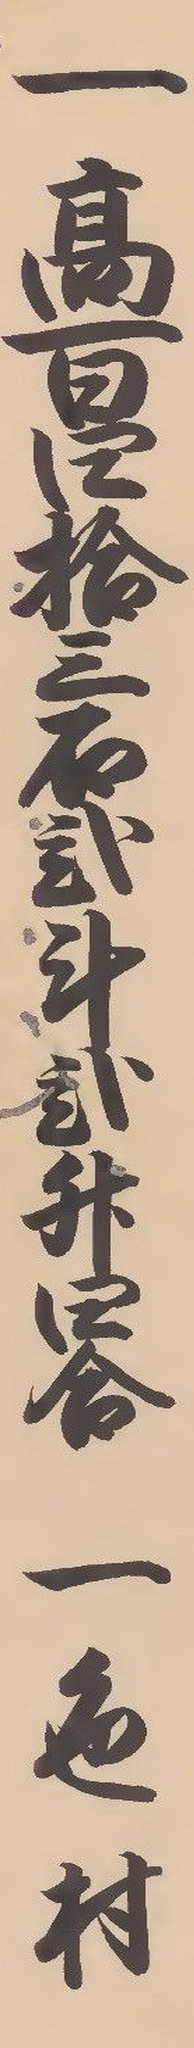一高百四拾三石弐斗弐升四合一色村

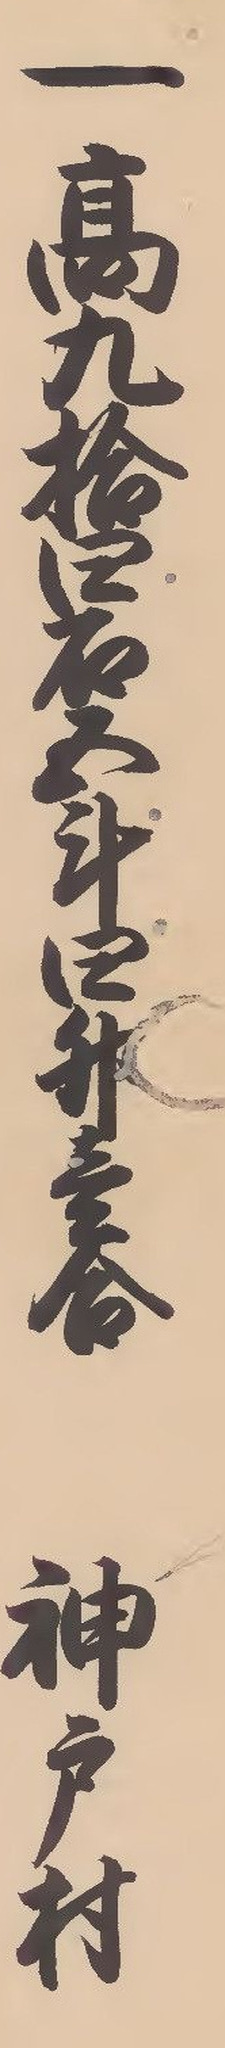一高九拾四石五斗四升壱合神戸村
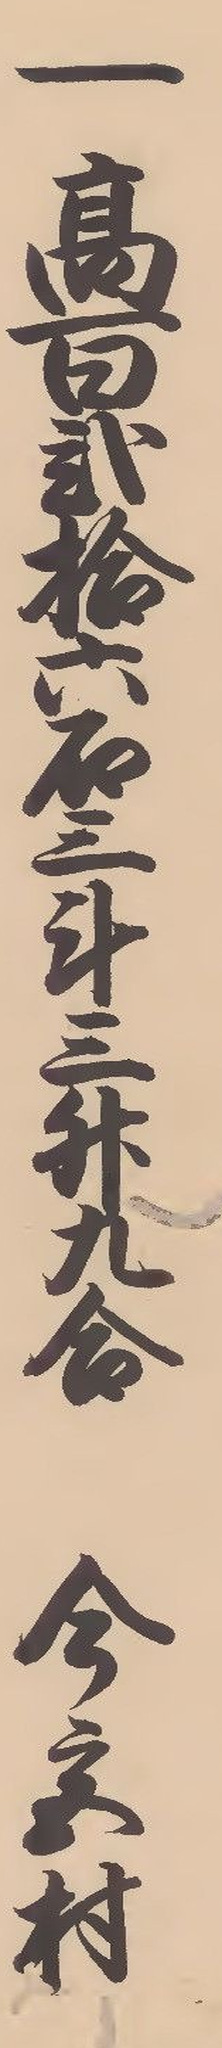一高百弐拾六石三斗三升九合今宮村
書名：駿河国郷帳
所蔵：国立公文書館 National Archives of Japan
